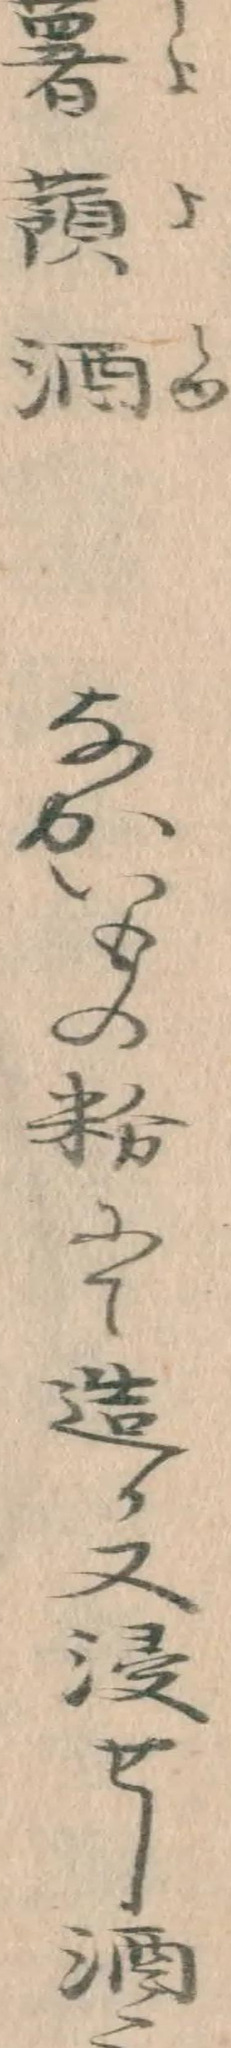薯蕷酒なかいもの粉にて造り又浸せし酒也
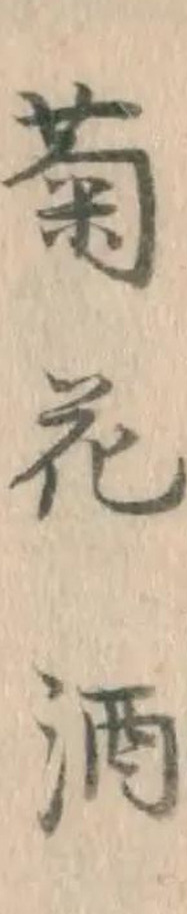菊花酒

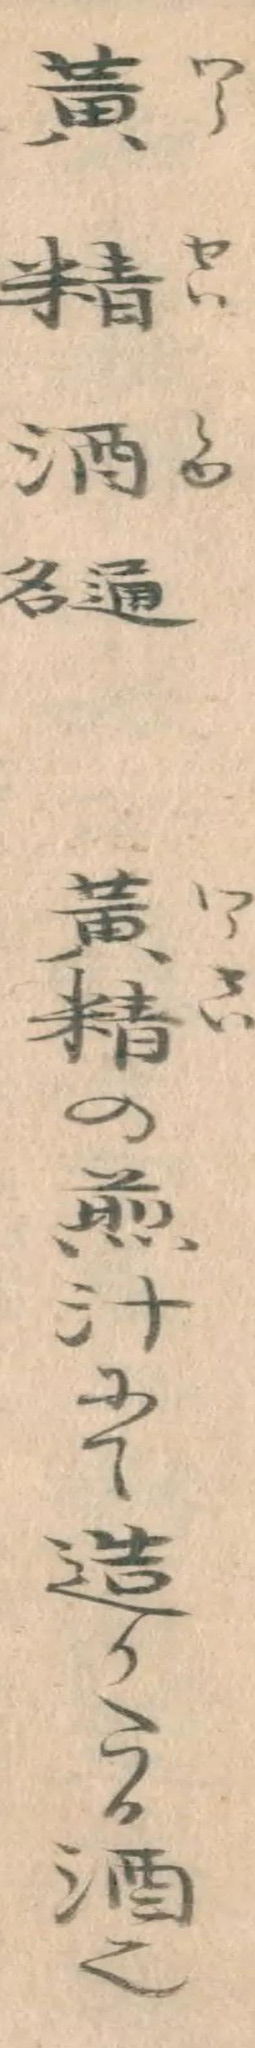黄精酒通名黄精の煎汁にて造りたる酒也
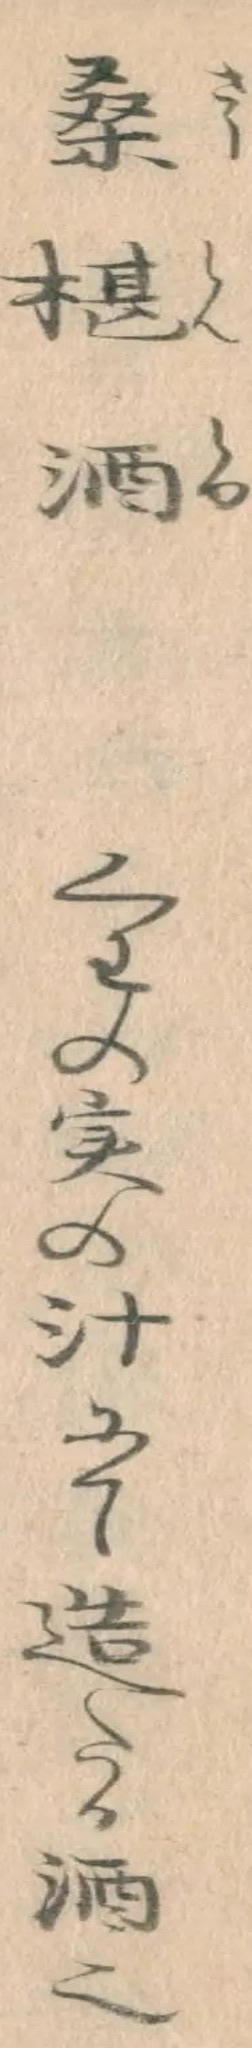桑椹酒くわの実の汁にて造たる酒也
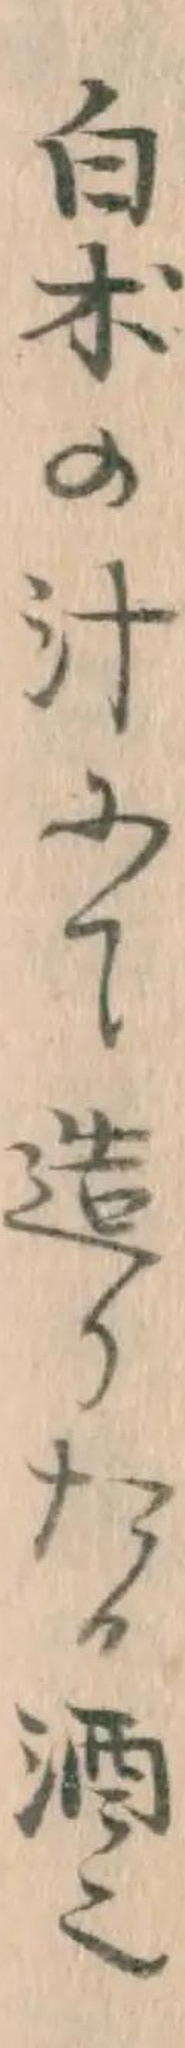朮酒白朮の汁にて造りたる酒也
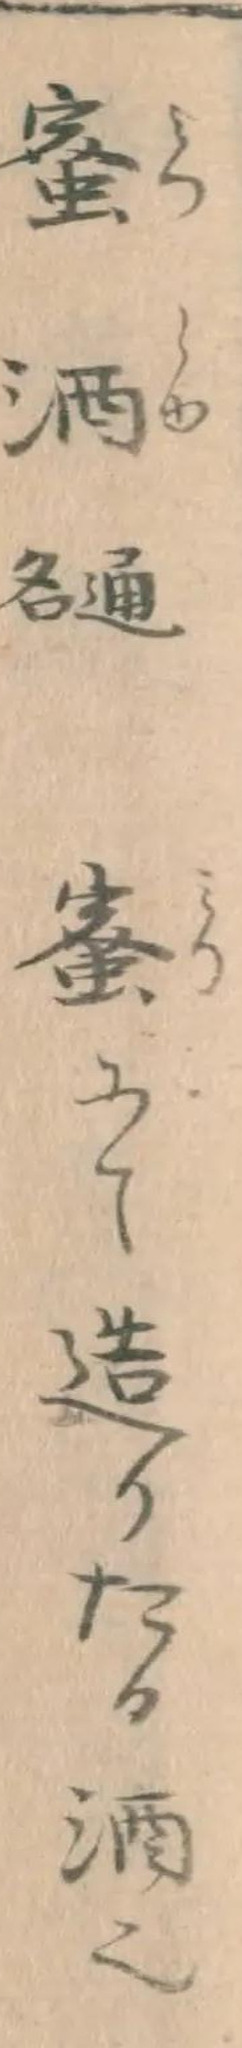蜜酒通名蜜にて造りたる酒也
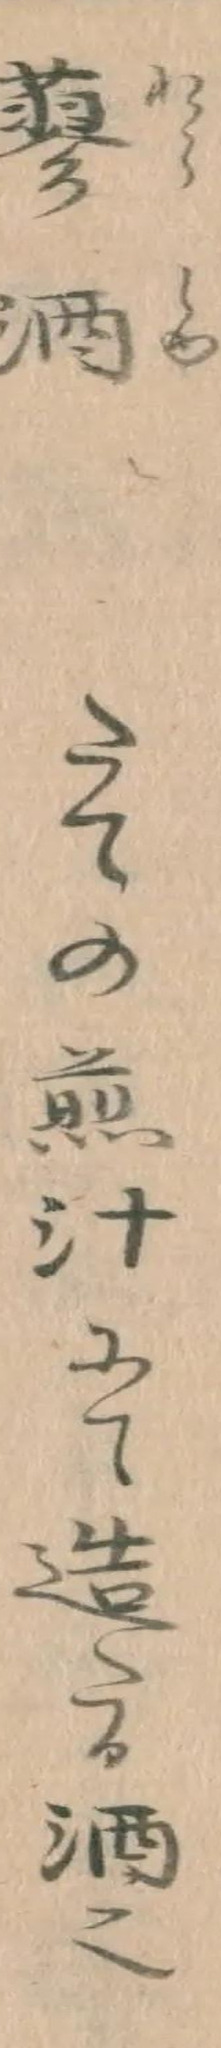蓼酒たての煎汁にて造たる酒也
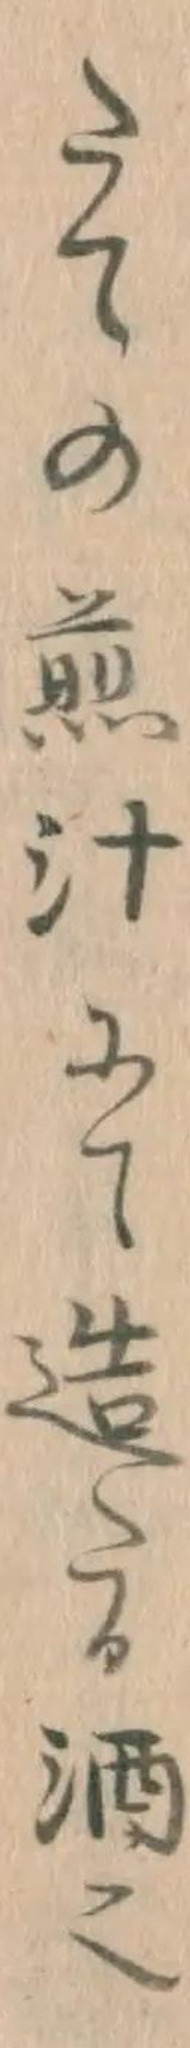蓼酒たての煎汁にて造たる酒也
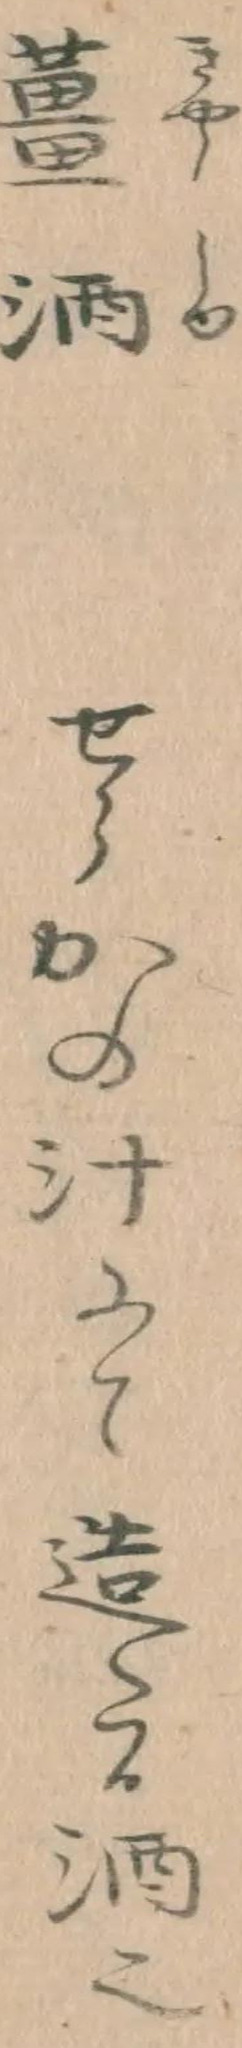薑酒せうかの汁にて造たる酒也
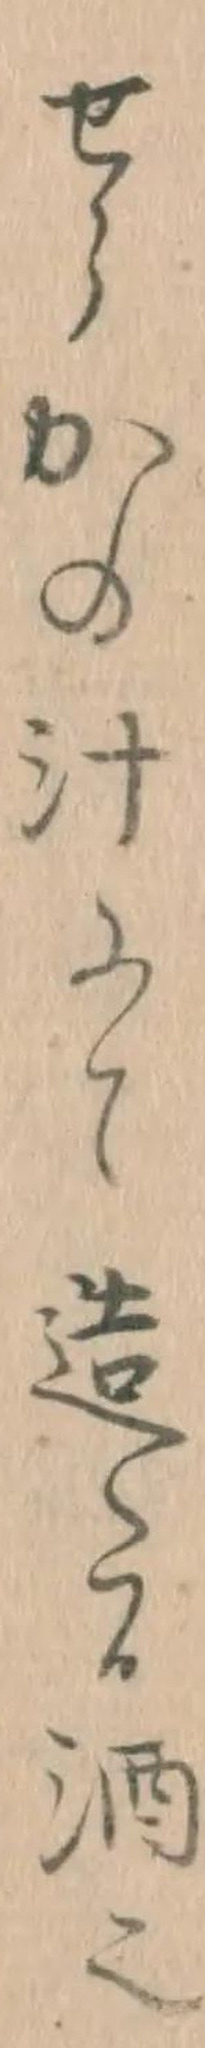薑酒せうかの汁にて造たる酒也
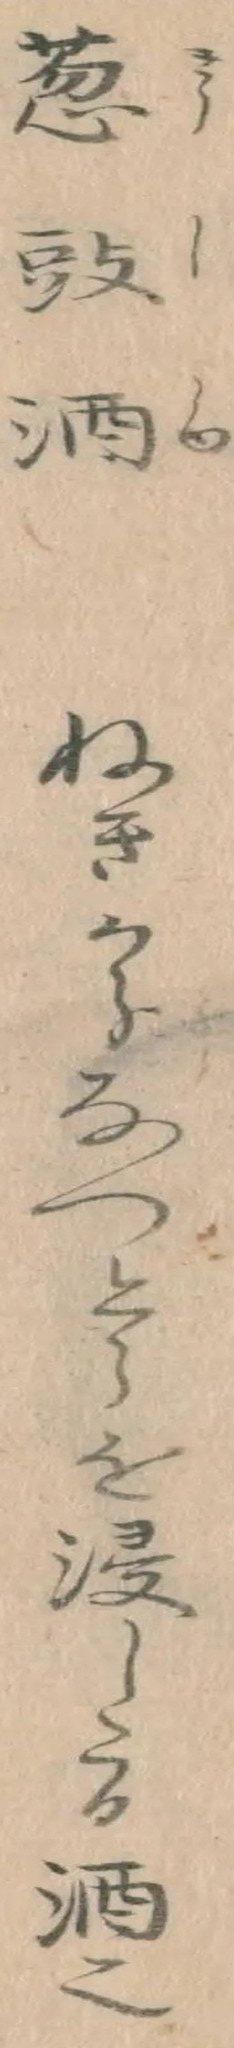葱豉酒ねきからなつとうを浸したる酒也
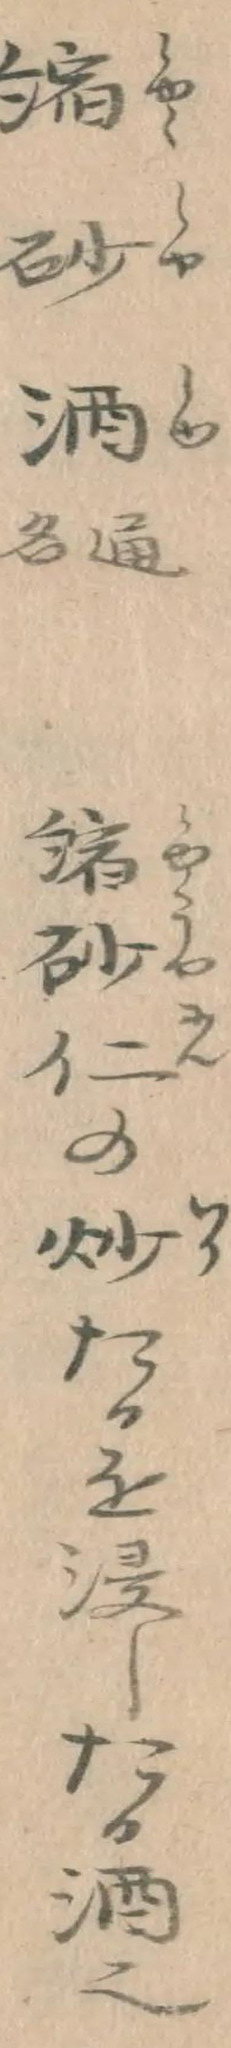縮砂酒通名縮砂仁の炒たるを浸したる酒也

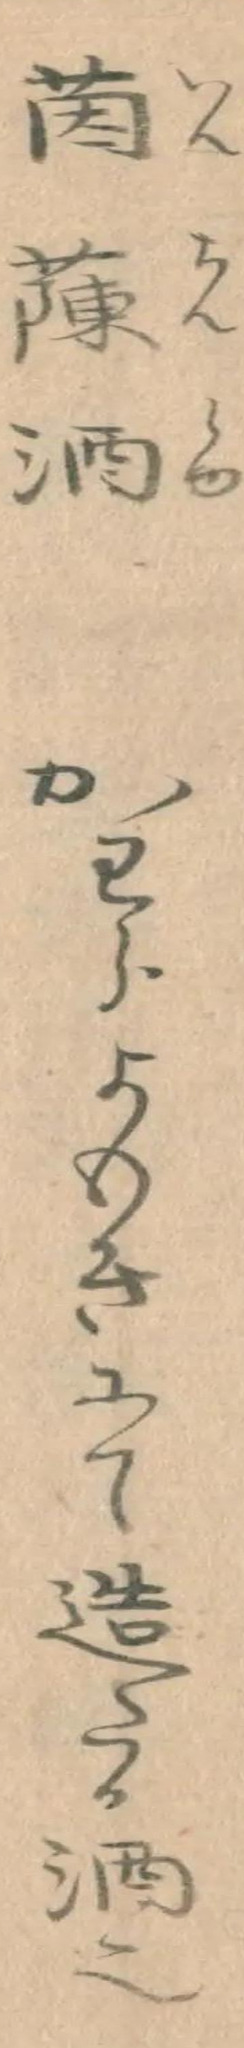茵蔯酒かわらよもきにて造たる酒也
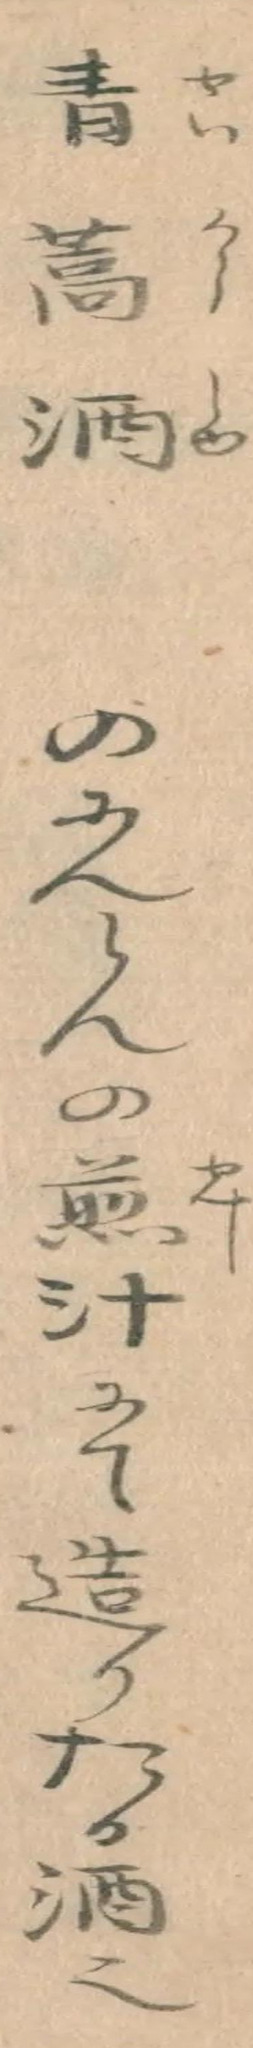青蒿酒のにんしんの煎汁にて造りたる酒也
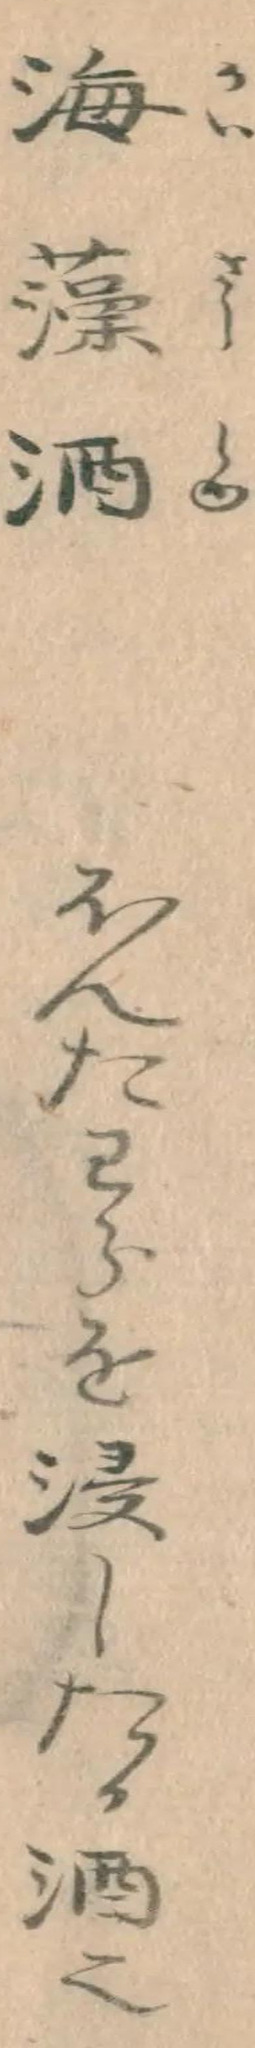海藻酒ほんたわらを浸したる酒也
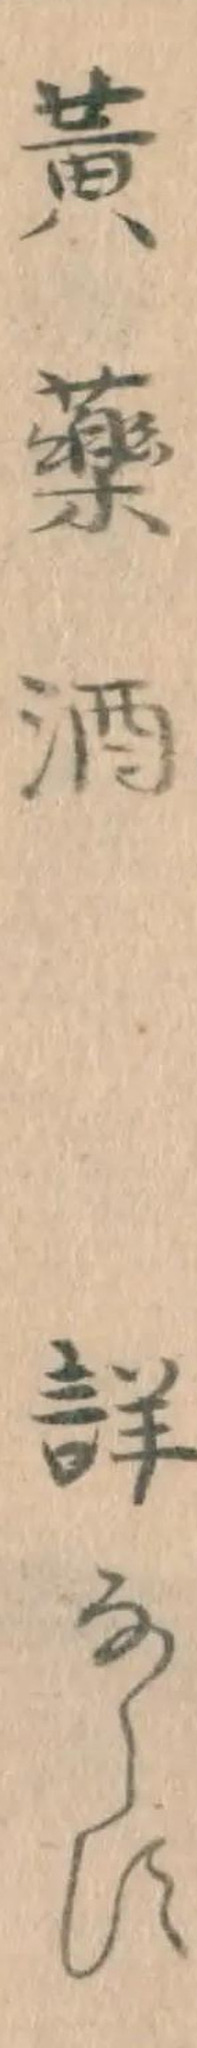黄薬酒詳ならす
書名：本草図譜. 巻43-45
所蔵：国立国会図書館 National Diet Library, JAPAN
